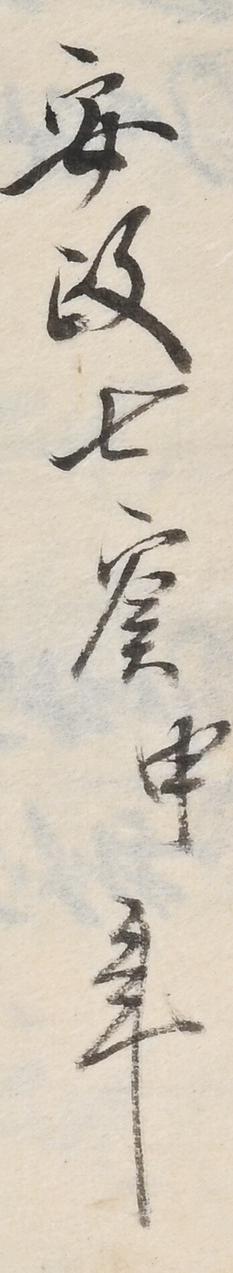安政七庚申年
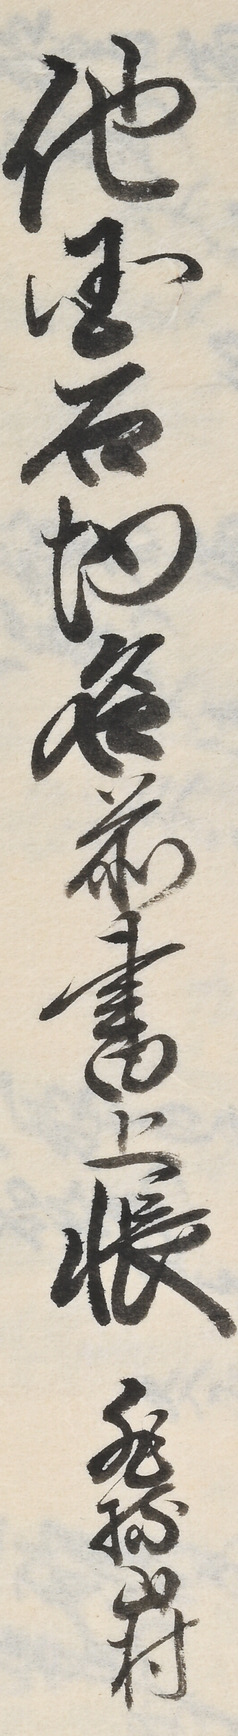他国石切名前書上帳非持山村

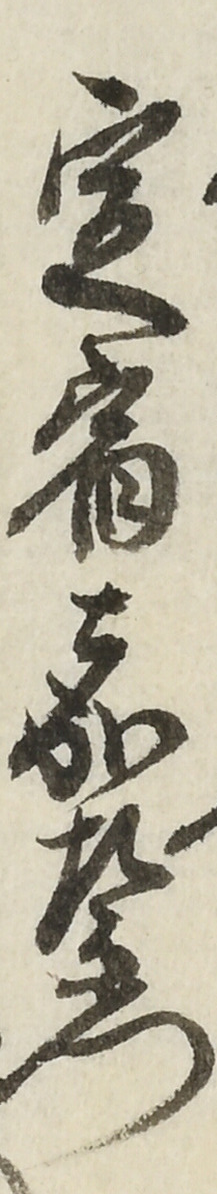定宿嘉左衛門
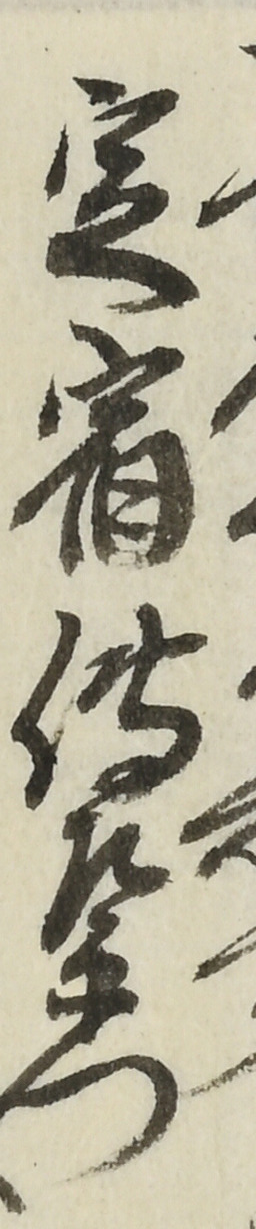定宿伝左衛門

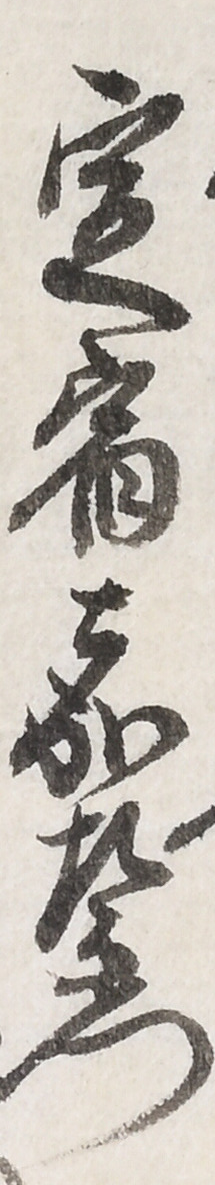定宿嘉左衛門
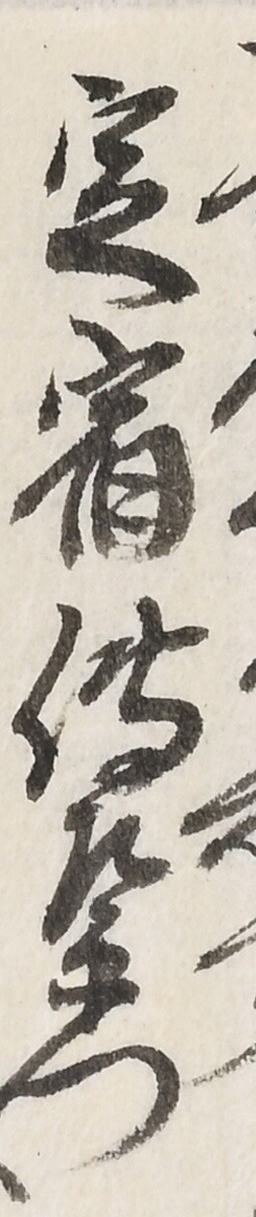定宿伝左衛門
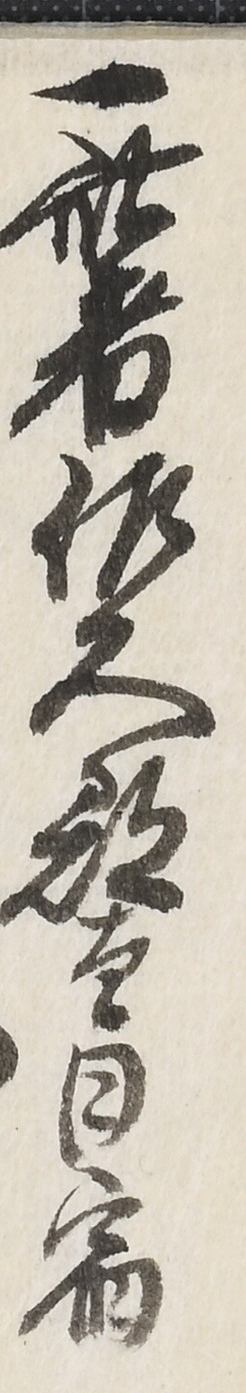一此者佐久郡望月宿
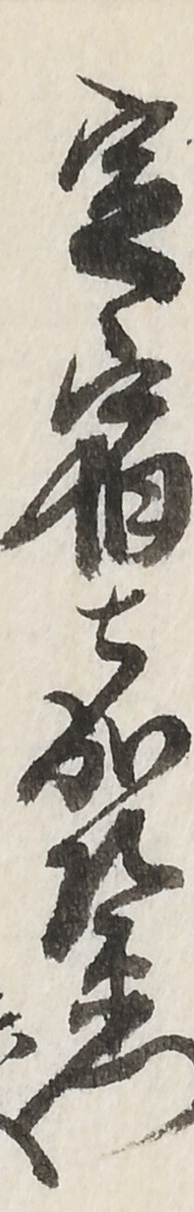定宿太治右衛門
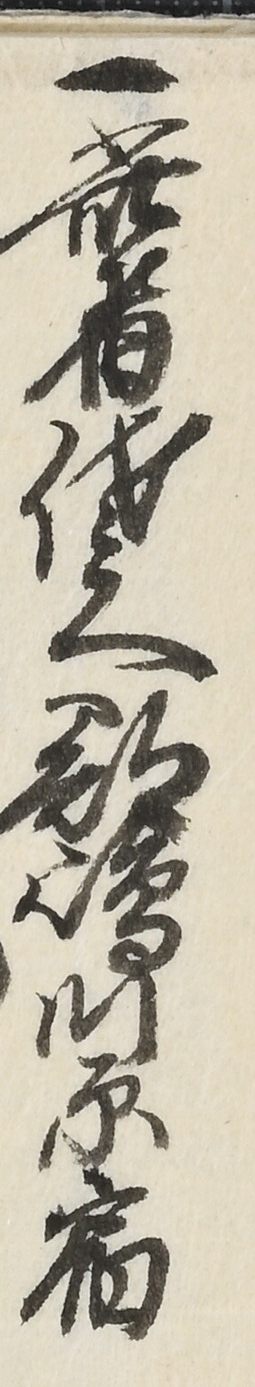一此者佐久郡島川原宿
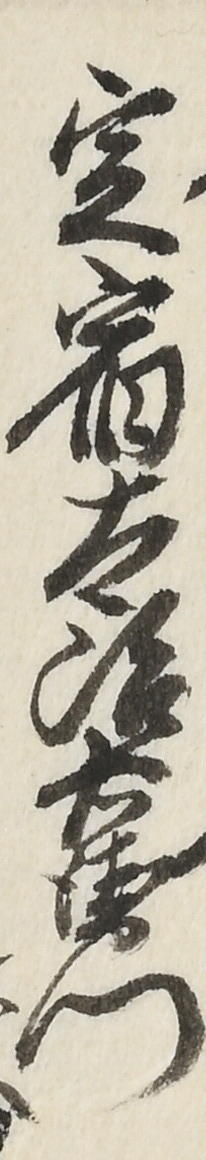定宿太治右衛門

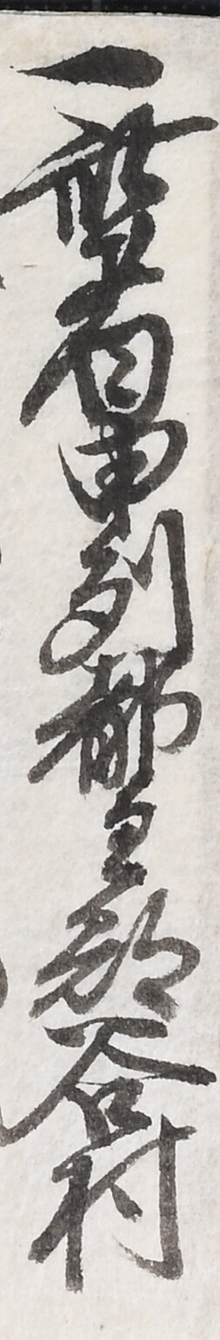一此者甲州都留郡谷村
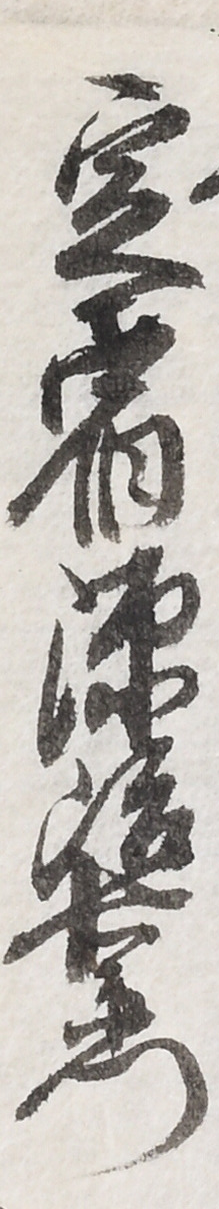定宿源治右衛門
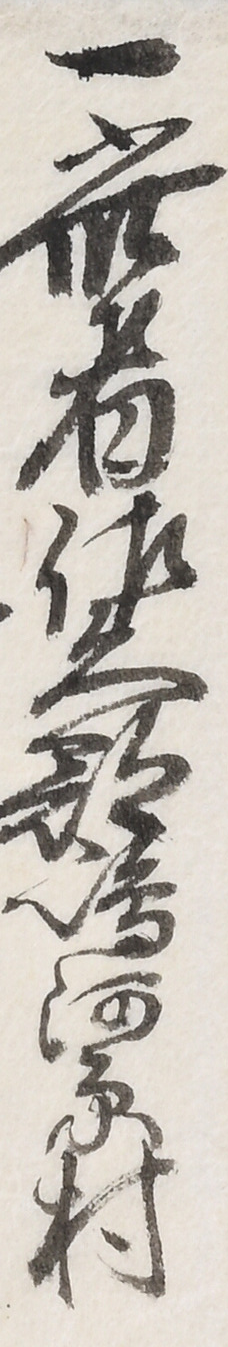一此者佐久郡島河原村
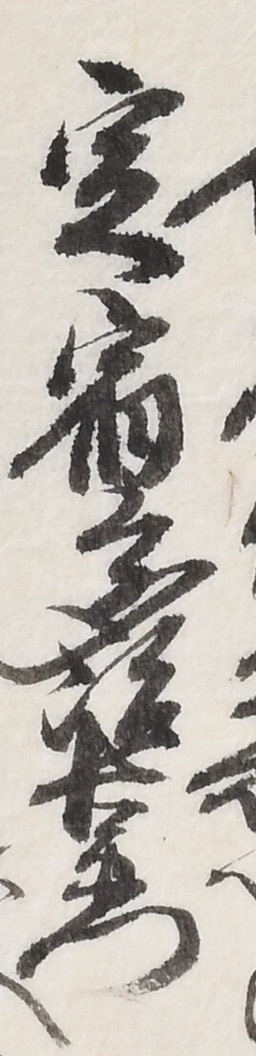定宿多治右衛門
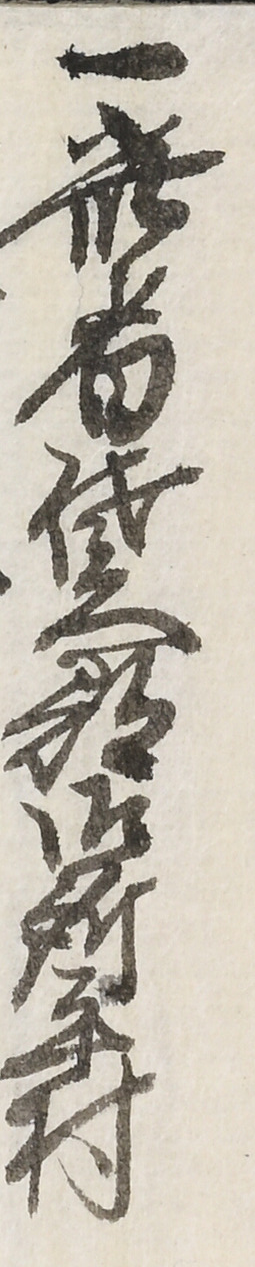一此者佐久郡御所平村
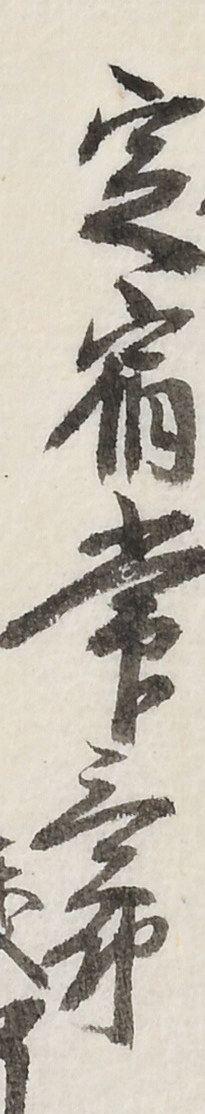定宿常三郎
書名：安政七庚申年正月他国石切名前書上帳
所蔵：伊那市立高遠町図書館・合同会社AMANE
